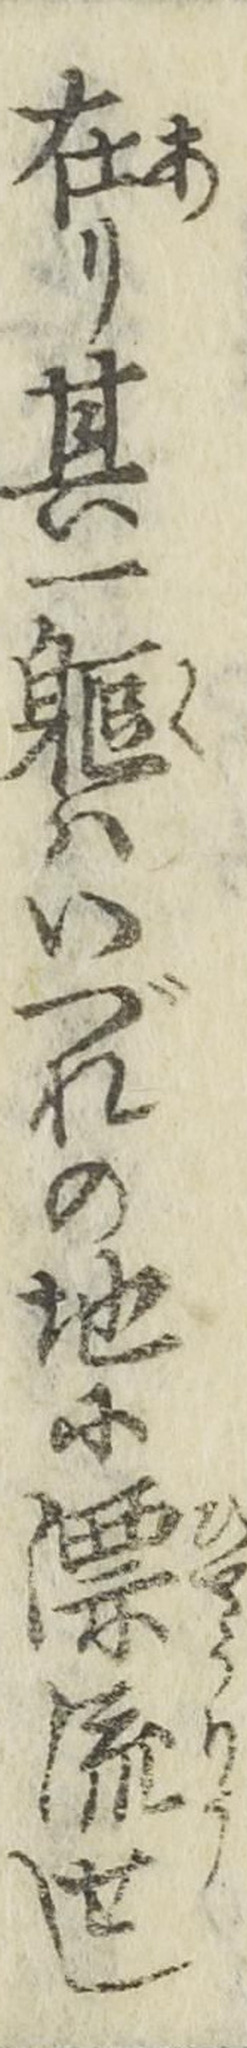在り其一躯はいづれの地に漂流せし
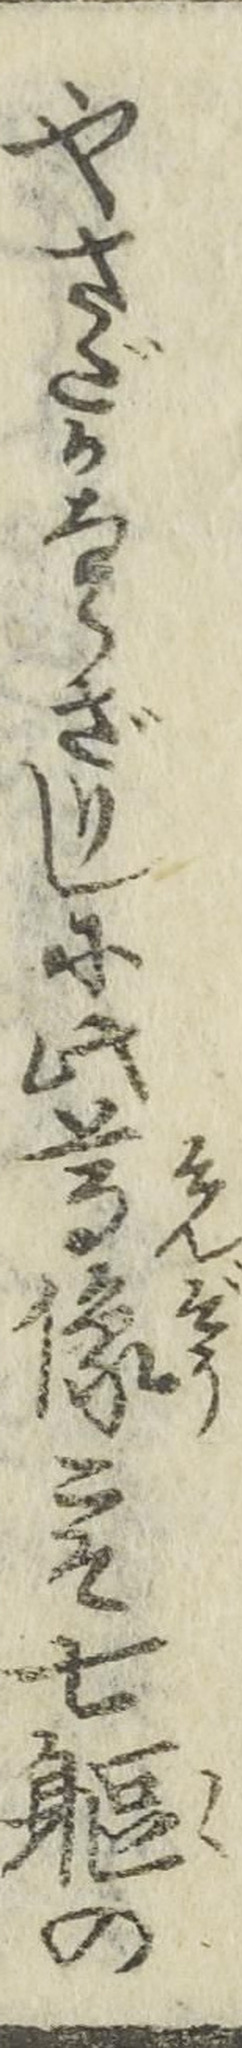やさだかならざりしに此尊像こそ七躯の
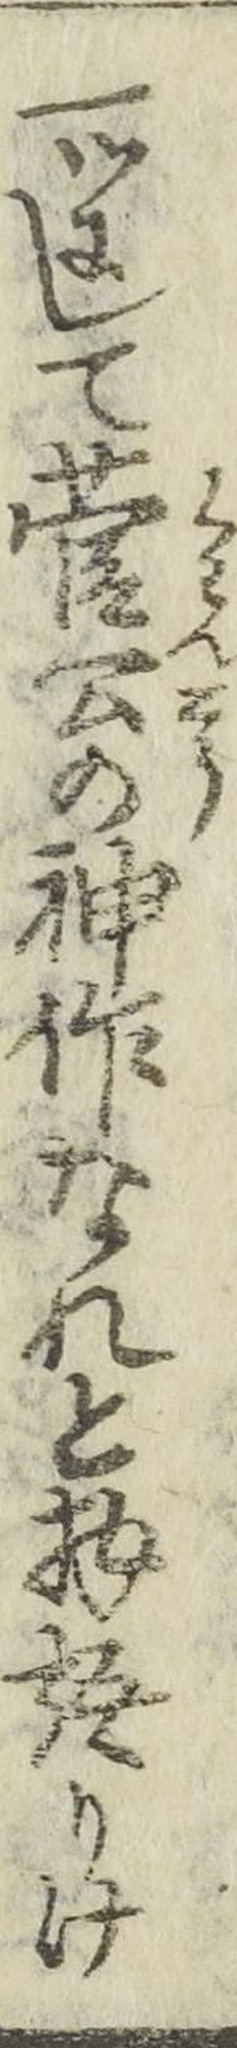一ツにして菅公の神作なれと物語りけ
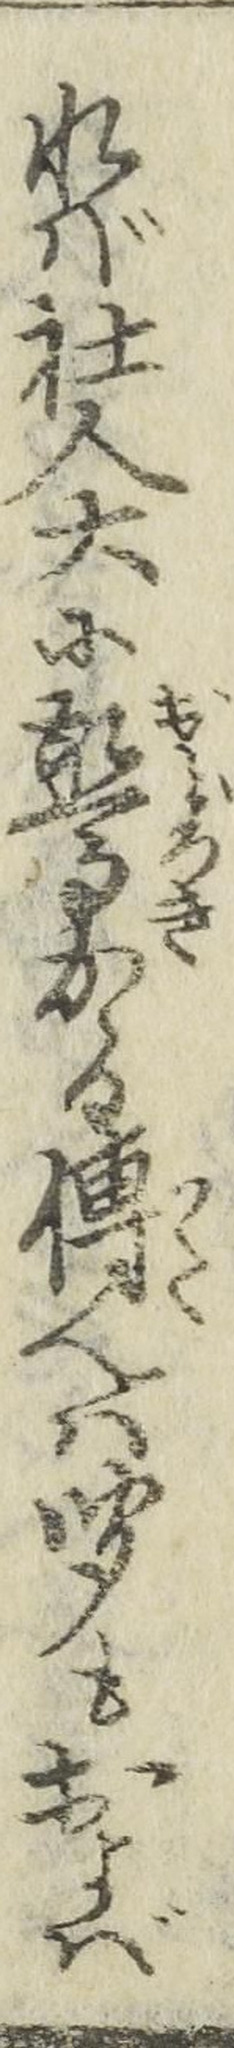れば社人大に驚かゝる伝へは聞もおよば
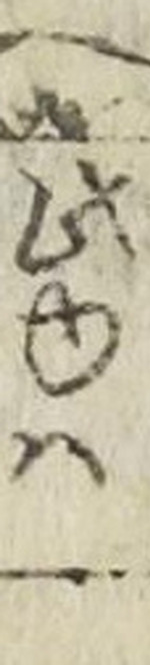此ゆは
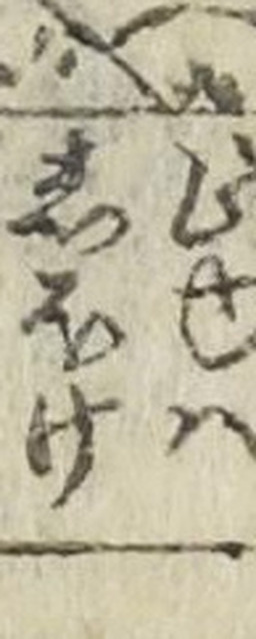しほけ
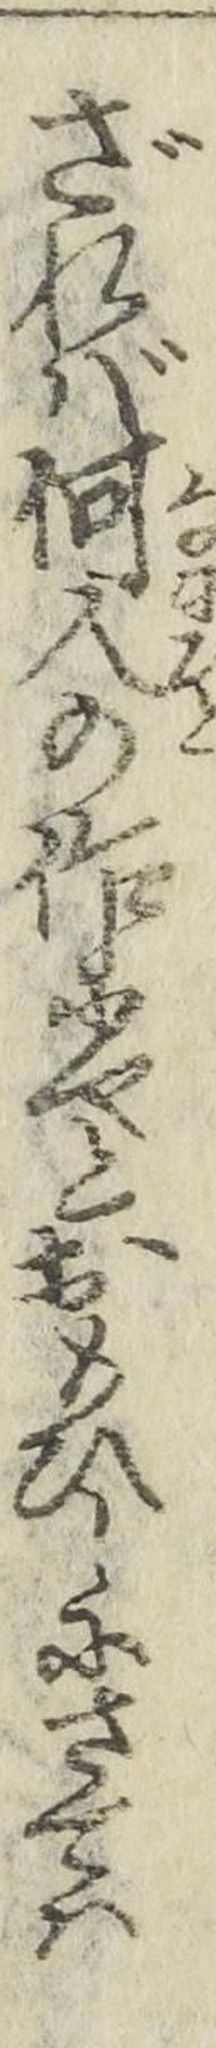ざれば何人の作にやとおもひしにさては
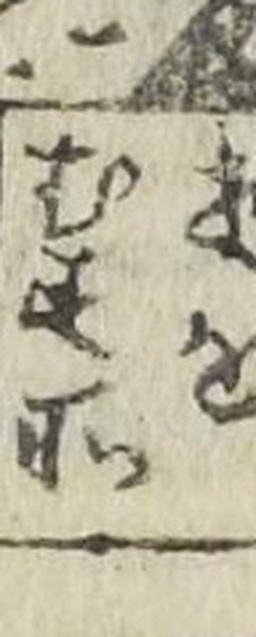むす所
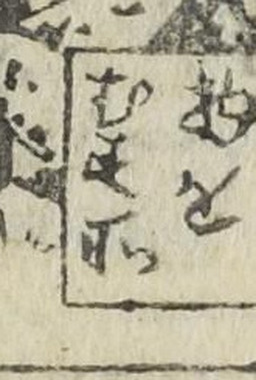むす所
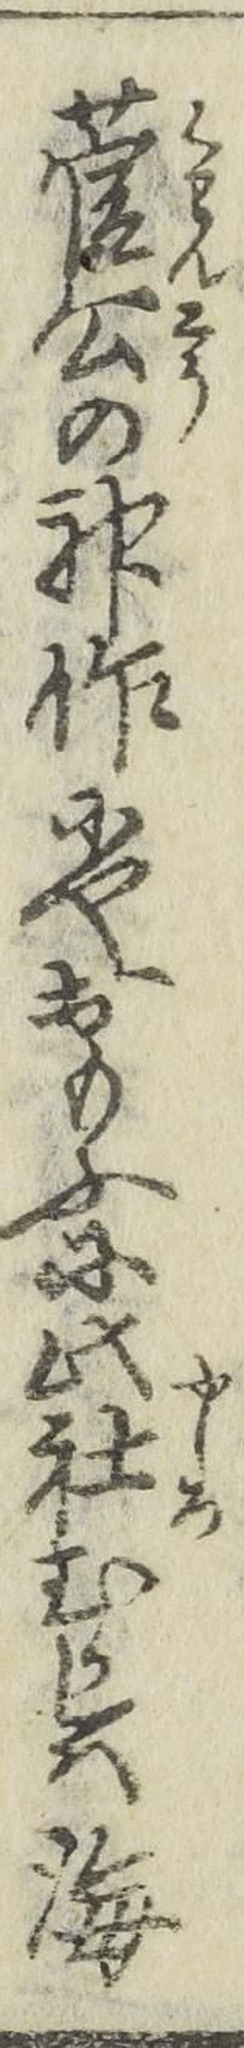菅公の神作にやおもふに此社むかしは海
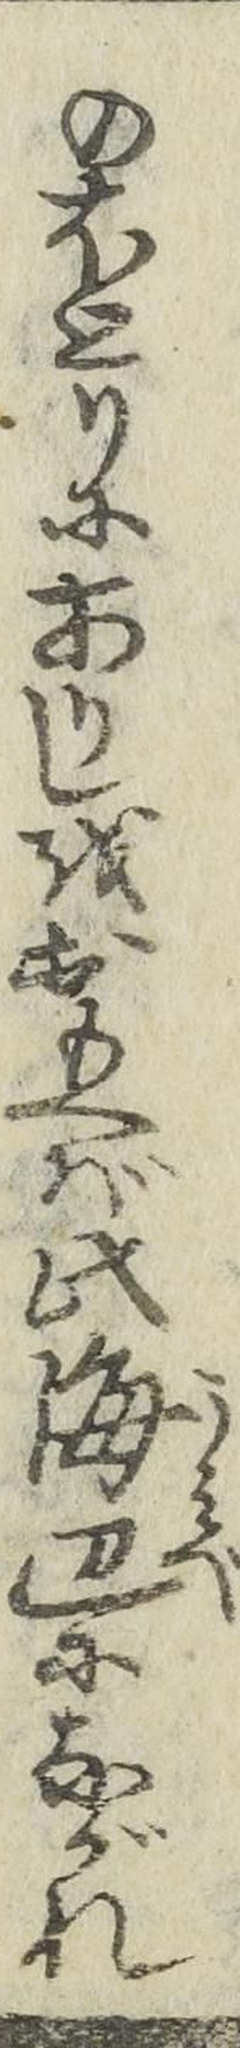のほとりにありしをおもへば此海辺にながれ
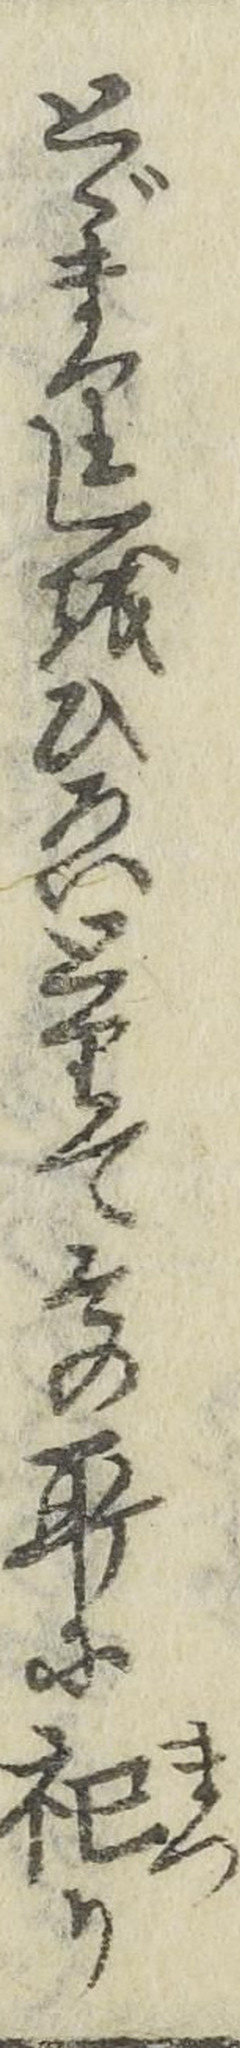とゞまりしをひろいとりてその所に祀り
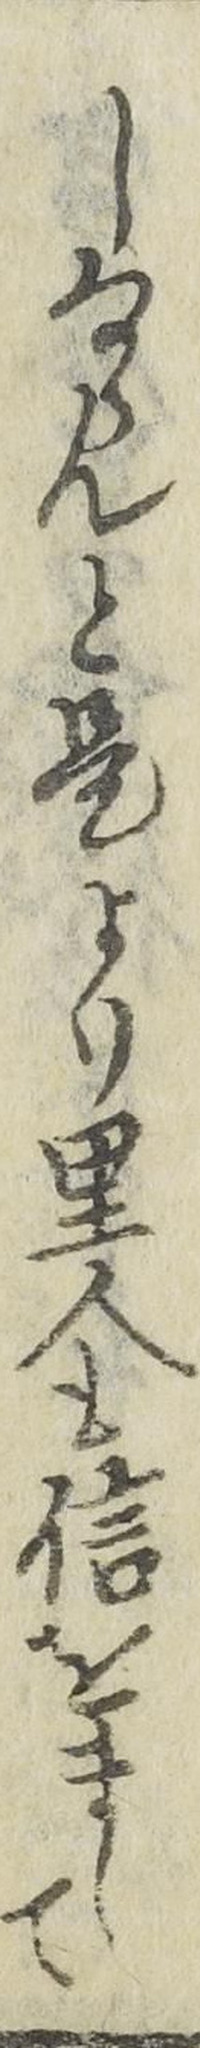しならんと是より里人も信をまして

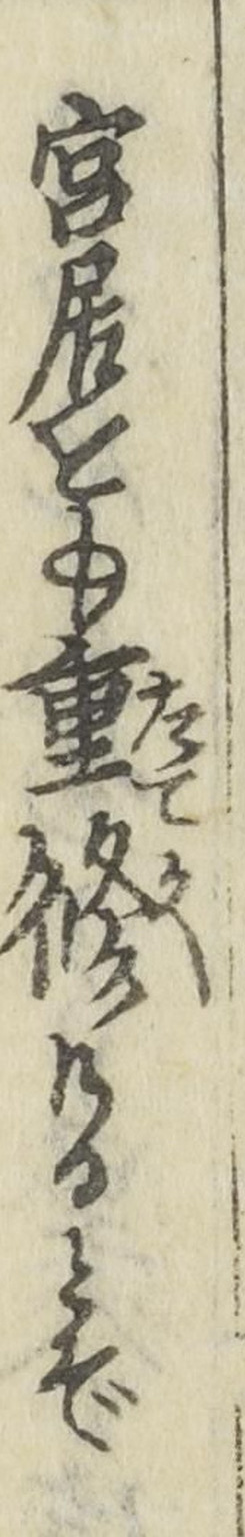宮居とも重修たるとぞ
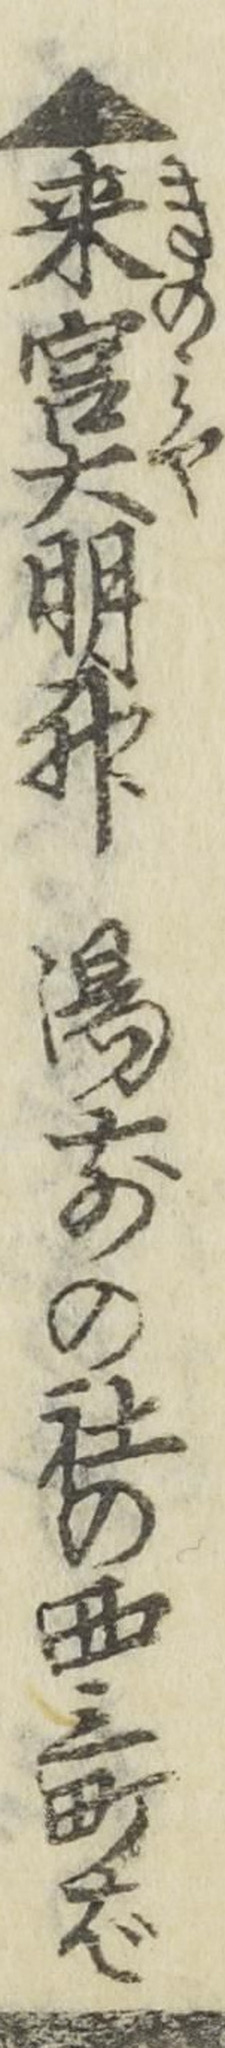▲来宮大明神湯前の社の西三町ば
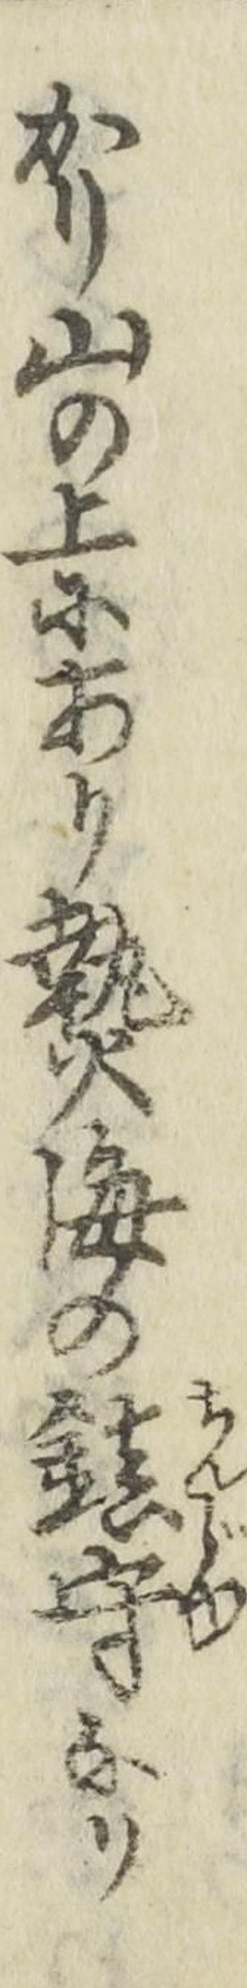かり山の上にあり熱海の鎮守なり
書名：熱海温泉圖彙
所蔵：東京大学地震研究所図書室 Earthquake Research Institute Library, The University of Tokyo, JAPAN
